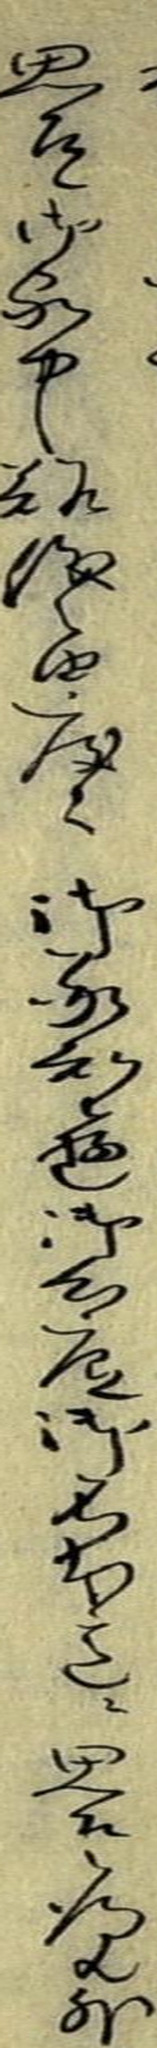思召候御家中難儀之由度々御承知被遊御心底御不本意に思召候得共外に
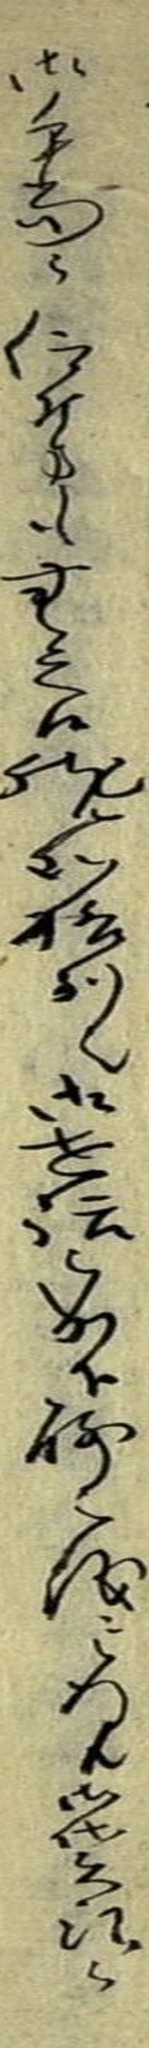御手当被仰付方も無之候然る処格別之御世話被成下聊之儀に候得共御貸銀被
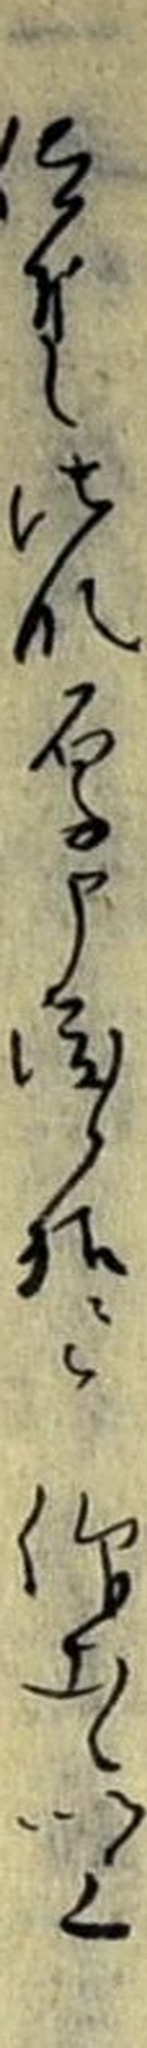仰付候此段厚申渡候様に被仰出候以上
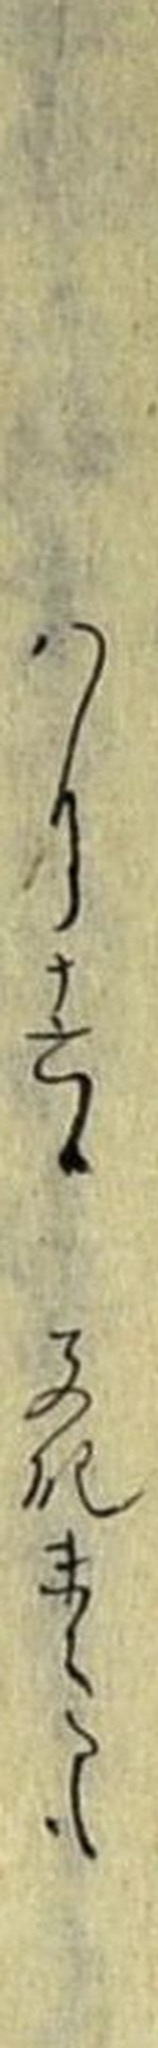八月十六日支配末々へも
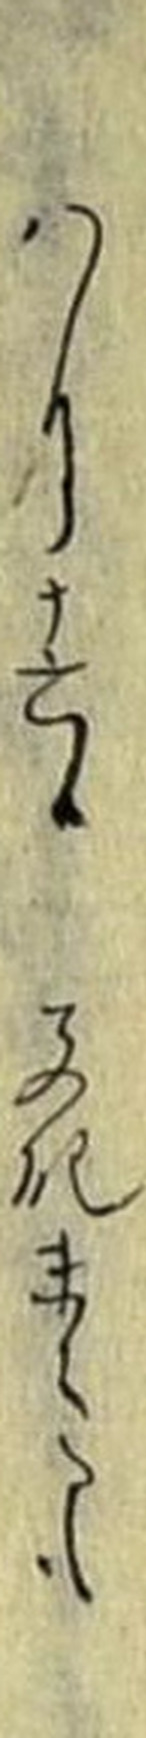八月十六日支配末々へも
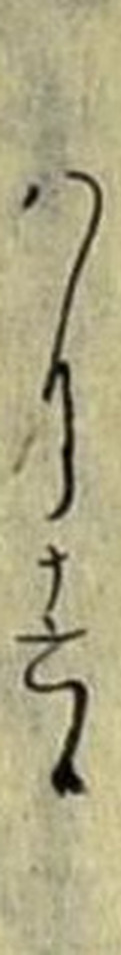八月十一日
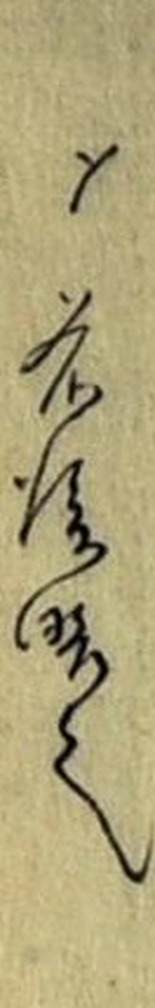〆前後略之

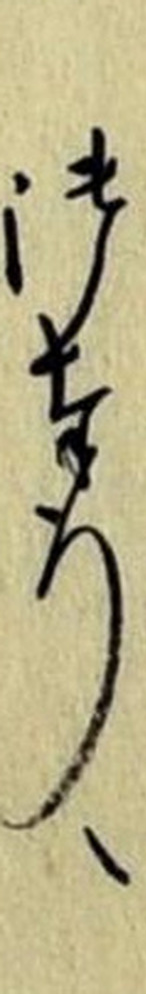御奉行へ
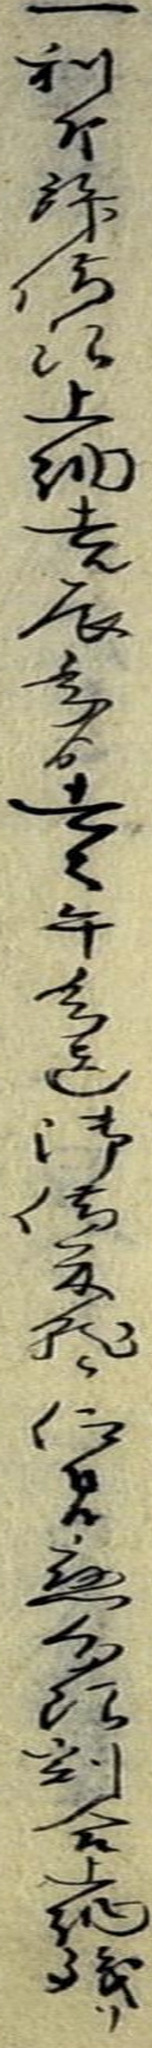一利付拝借銀上納去る辰年ゟ去々午年迄御借米就被仰付候応分限割合上納残り
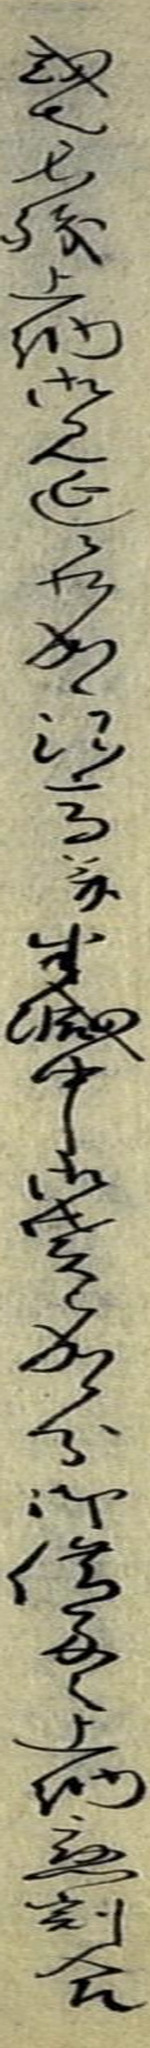或は不残上納御見延に相成候銀高并半減中御貸被成候分御借米之上納応割合
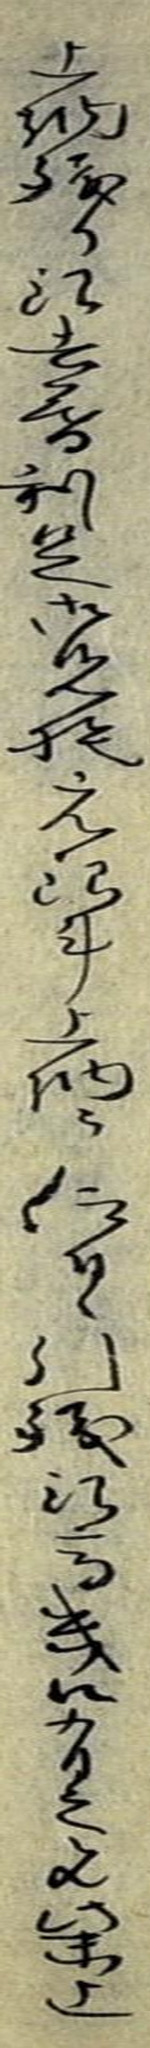上納残り銀去暮利足御見捨元銀斗上納被仰付候引残銀高幾口有之候共此末上
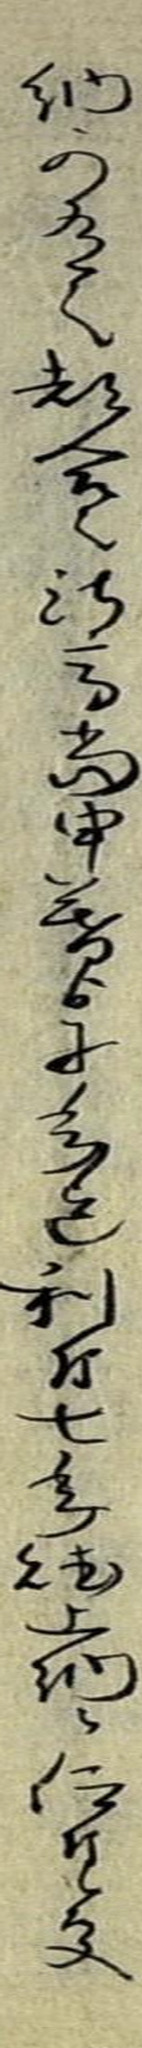納可有之都合之銀高当申暮ゟ刁年迄利付七年賦上納被仰付候事
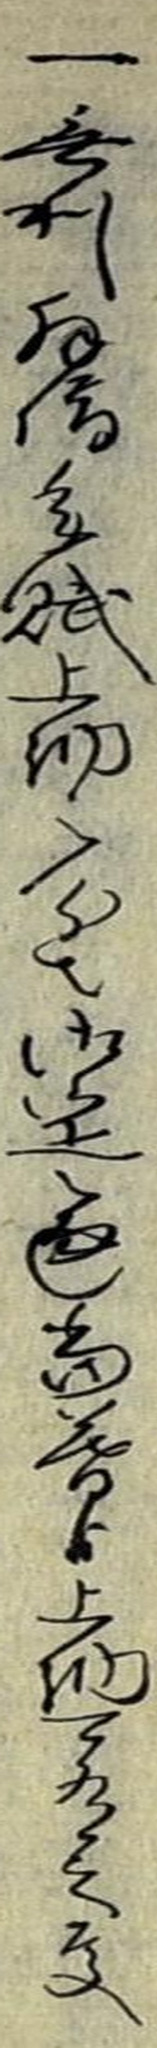一無利拝借年賦上納之分は御定之通当暮ゟ上納可有之事
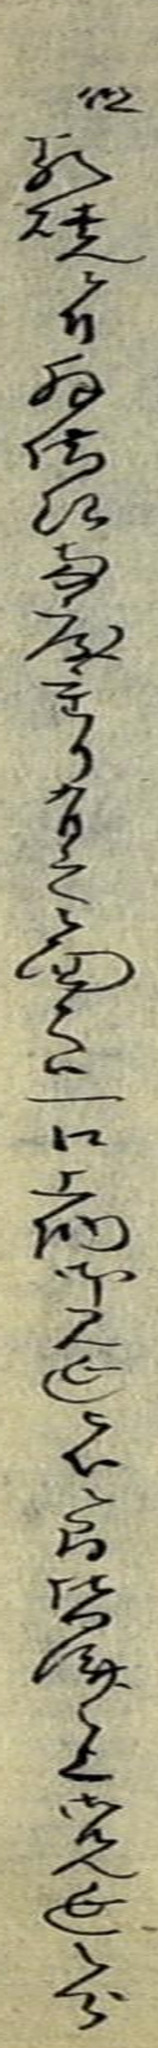但類焼に付拝借銀両度重り有之候面々は一口上納御見延被下候間皆済之上御見延之分
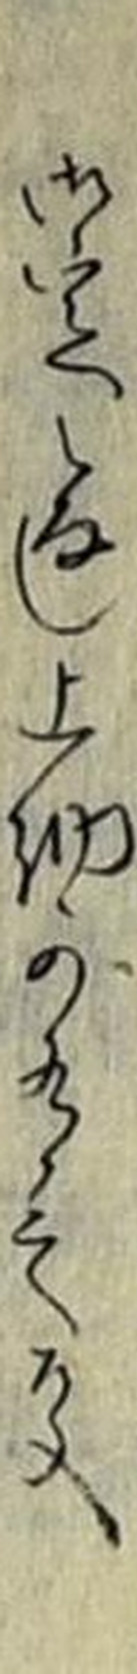御定之通上納可有之事
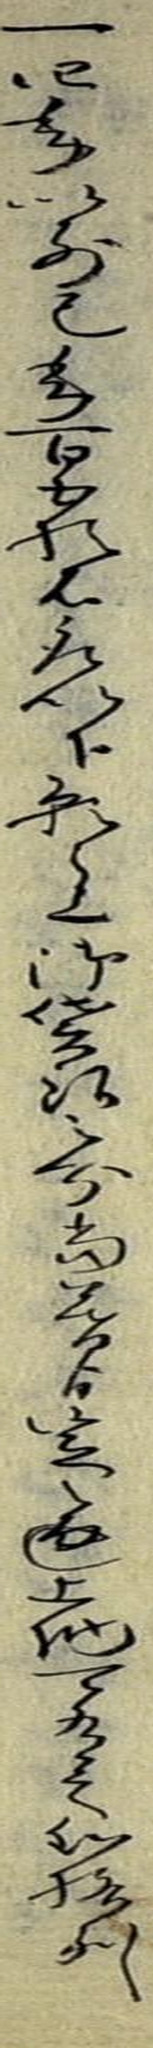一四年以前巳年百五拾石取以下願之上御貸銀之分当暮ゟ定之通上納可有之処格別
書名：命令之部 二
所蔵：福井県文書館 Fukui Prefectural Archives
